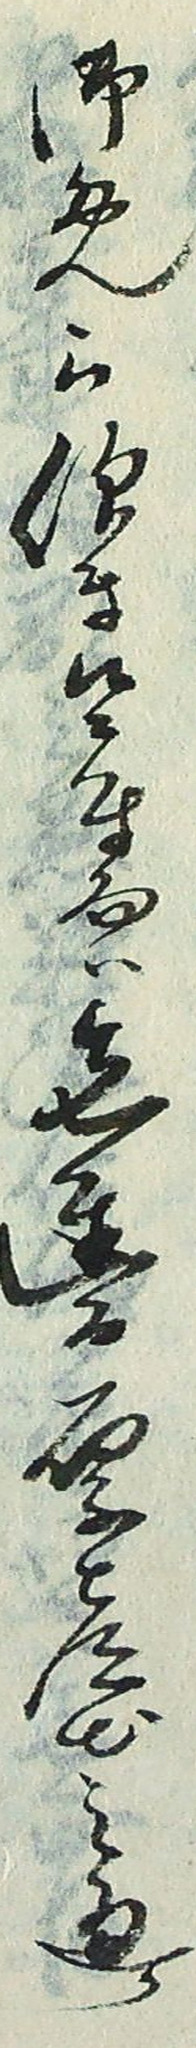御免被仰付候ニ付而ハ先達而厚被仰出之通り
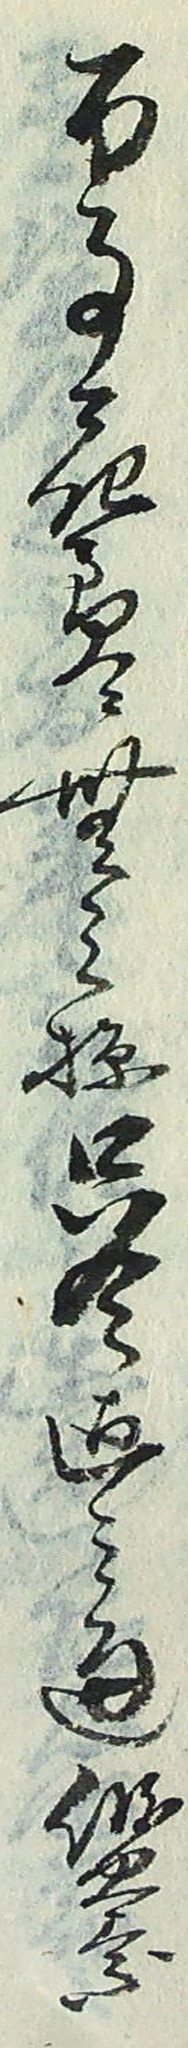万事花美ニ無之様只今迄之通質素
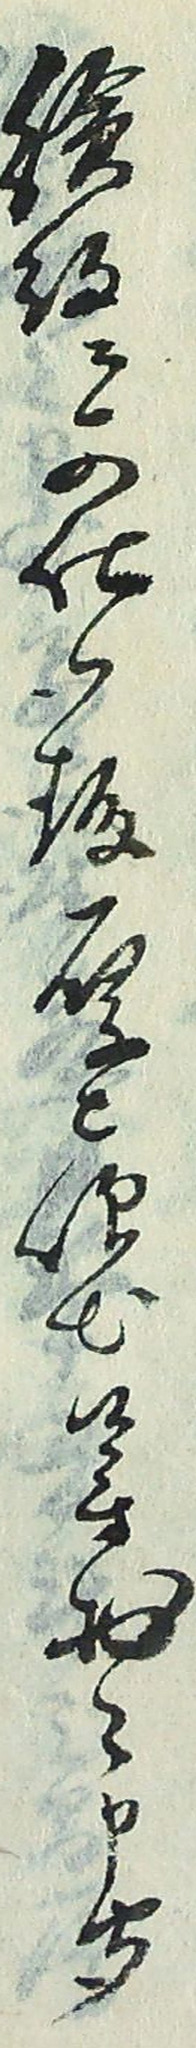倹約ニ可仕御趣厚被仰出候ニ付村々申聞
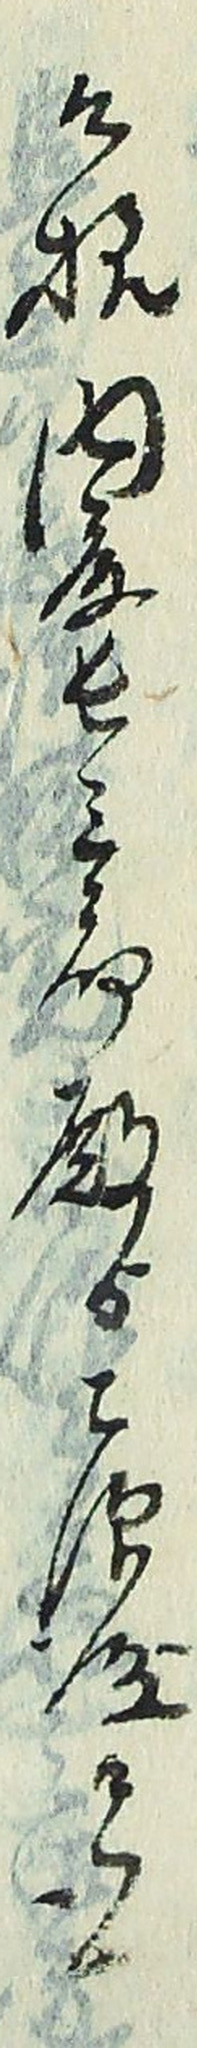候様内藤長三郎殿ゟ被仰渡候以上
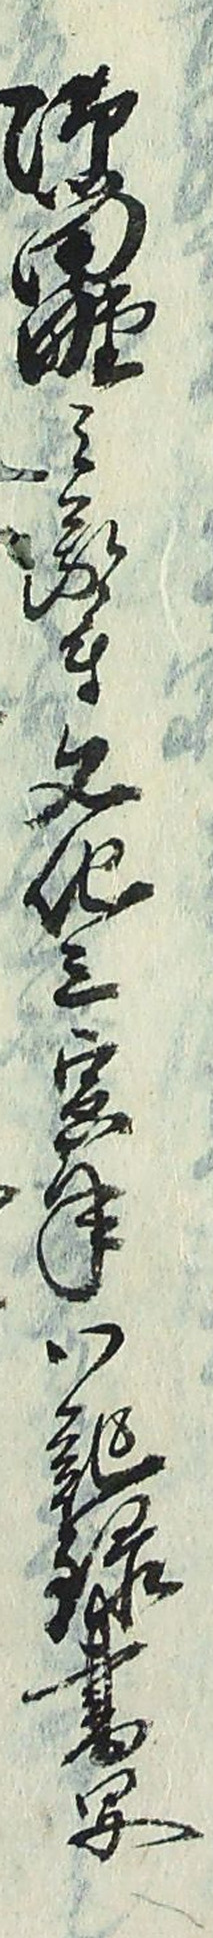御留野之義ニ付文化三寅年御記録書写
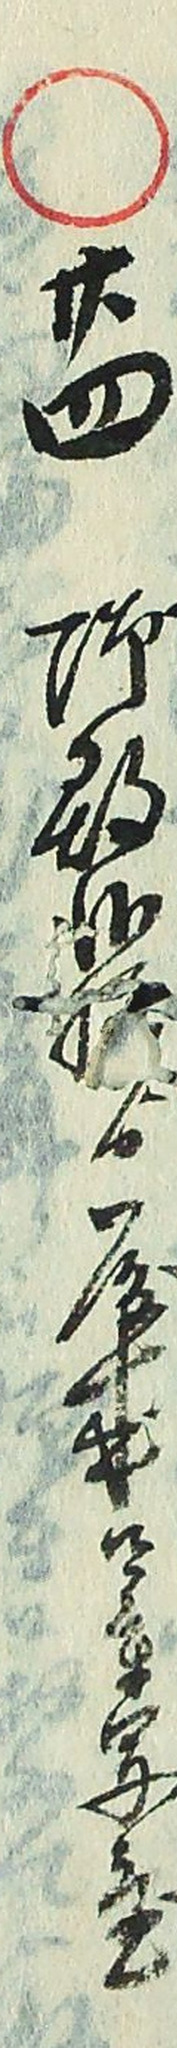○廿四御郡代様ゟ御渡成候ニ付写置
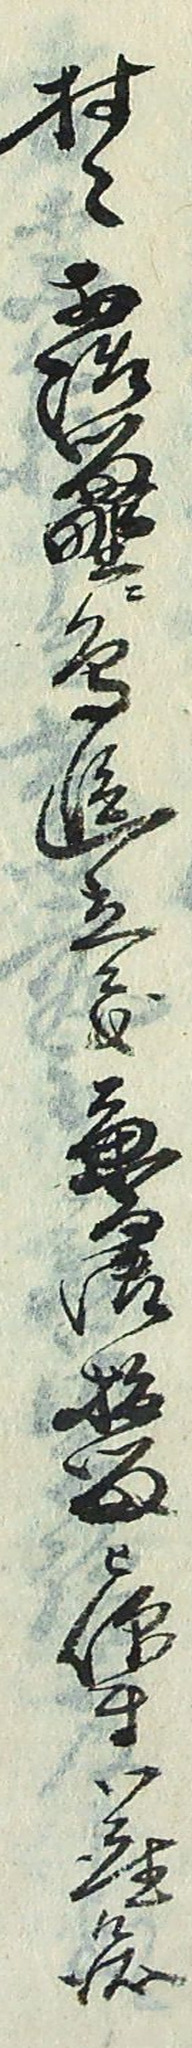村々於御留野ニ鳥追立之義兼而御指留被仰付御座候所
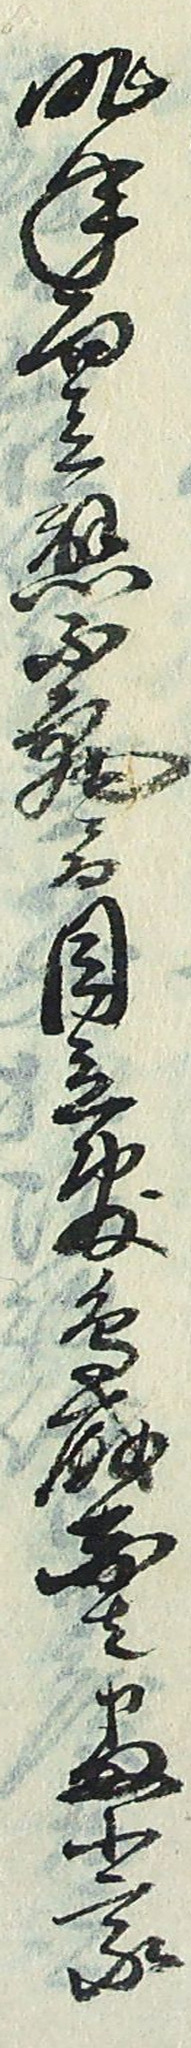昨年向者應不究ニ而目立敷鳥威亦者番小家
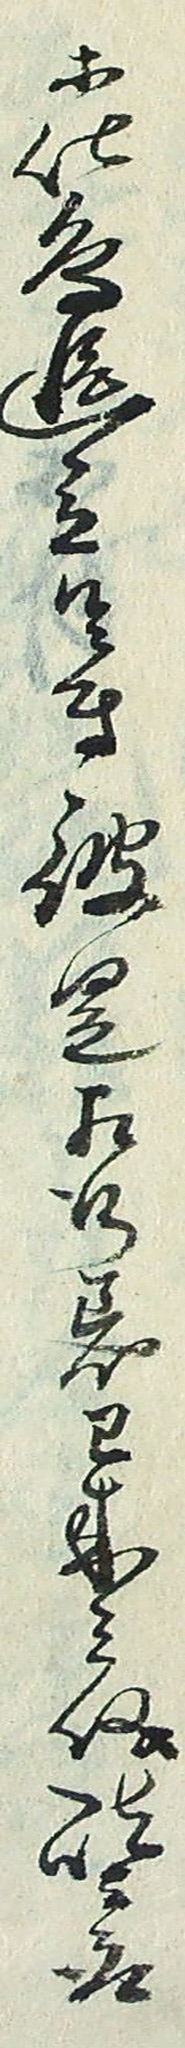等仕鳥追立候ニ付彼是相行着已来之儀屹と取
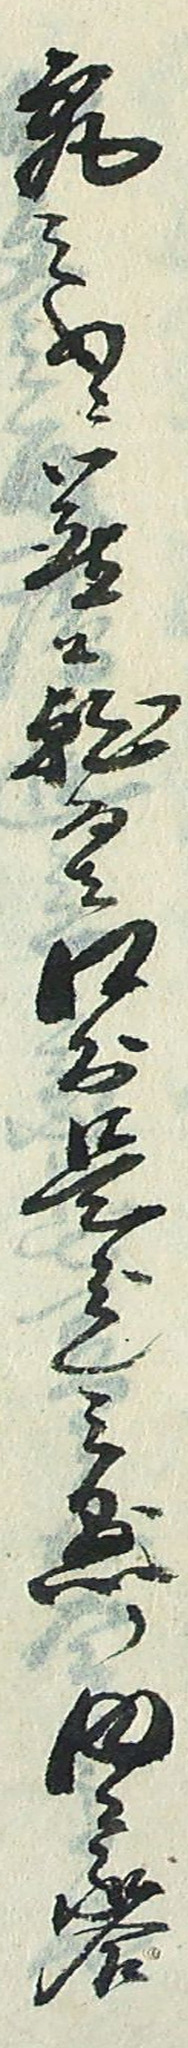究之義ニ御座候就而ハ郷分是迄之懸り内々承合
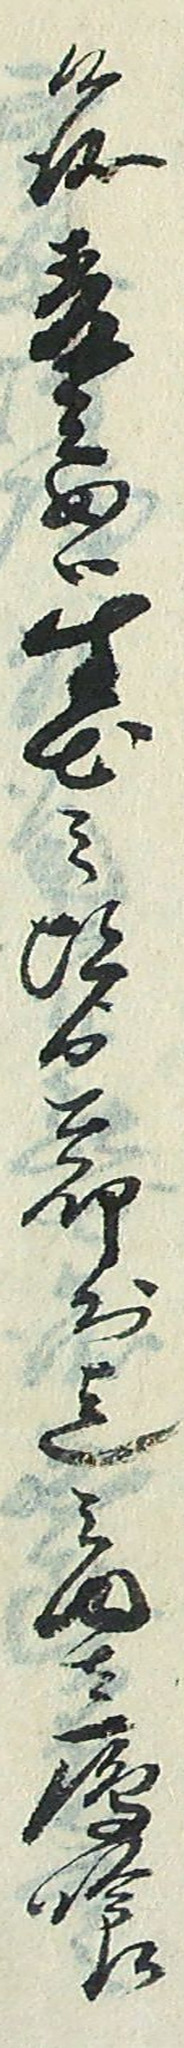候所麦之義ハ生出之頃ゟ節分迄之内者鴈喰

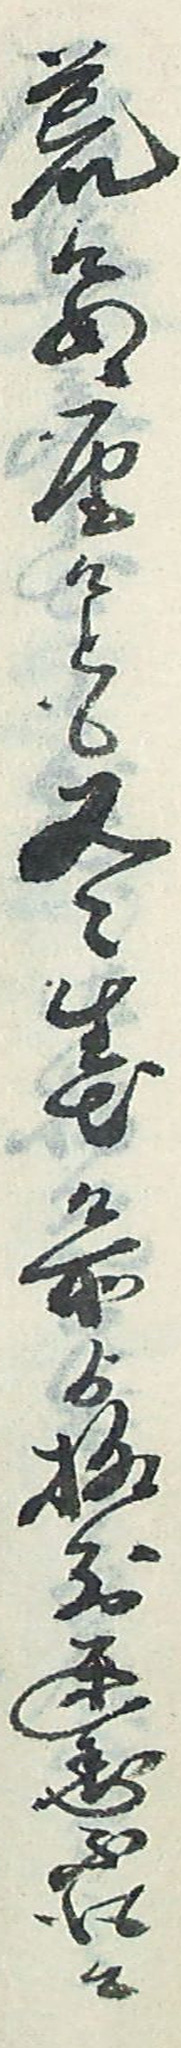荒候義御坐候とも又々生出候所ゟ格別迷惑不仕候
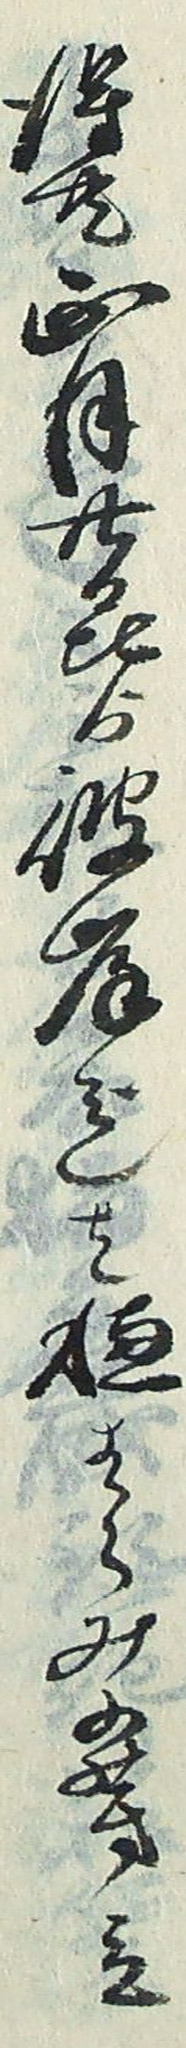得共正月廿日比ゟ彼岸迄者穂はらみの芽立
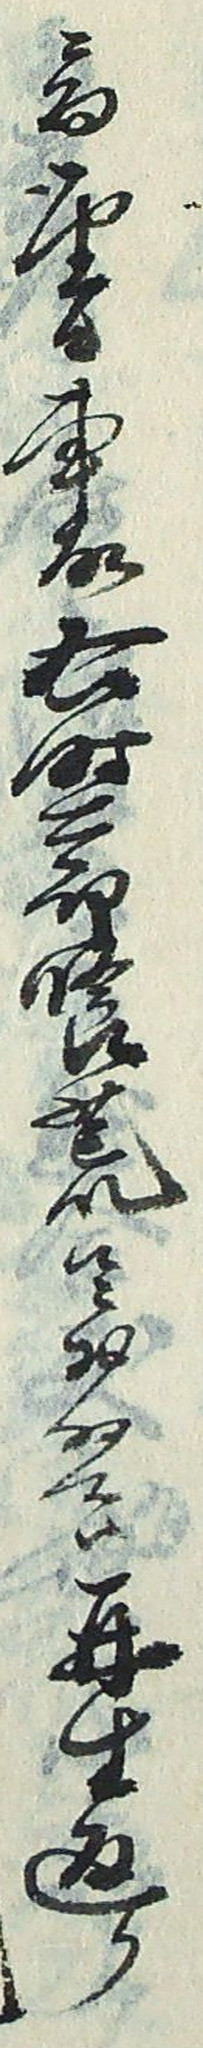ニ而御坐候事故右時節喰荒候ニおゐてハ再生返り
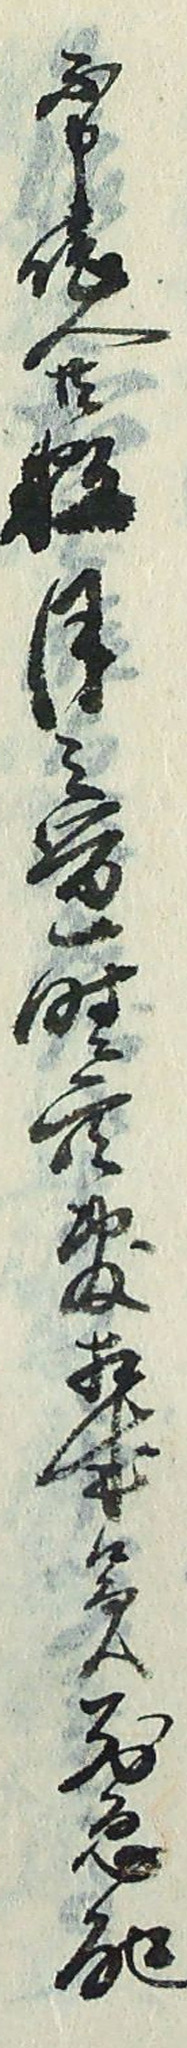不申作人共数月之労一時ニ空敷相成候而ハ別而心配
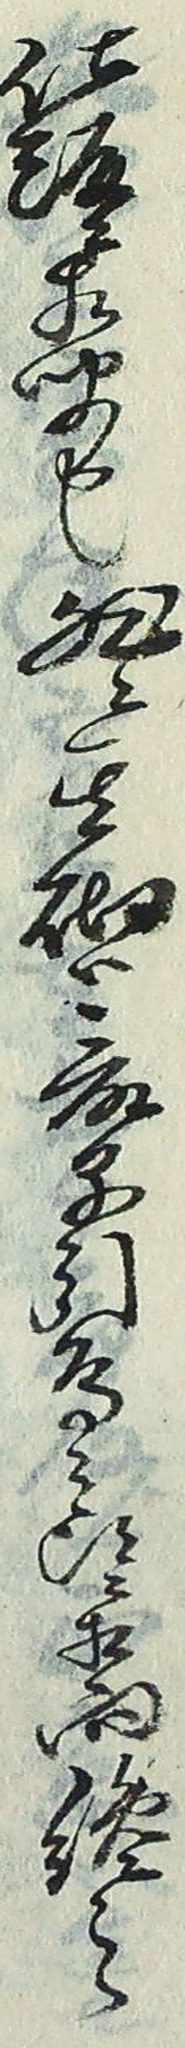仕趣ニ相聞申候然ニ其砌ハ最早引鳥之頃ニ相向讒之
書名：諸御趣意書并御下知向之写
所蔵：鳴門教育大学 Naruto University of Education
